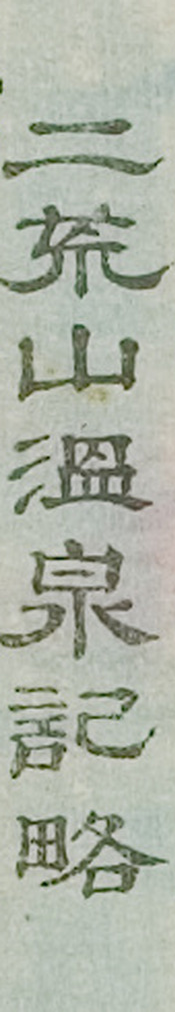二荒温泉記略
